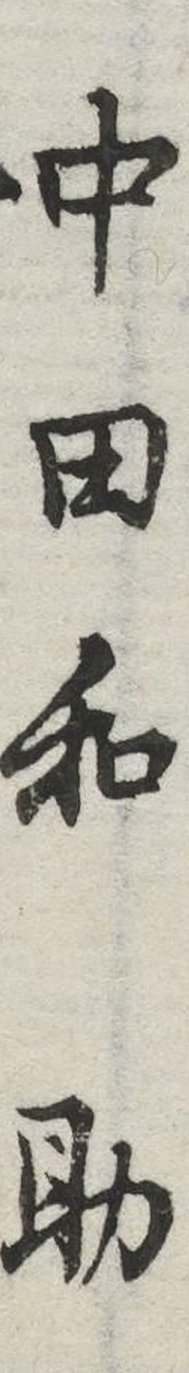中田和助
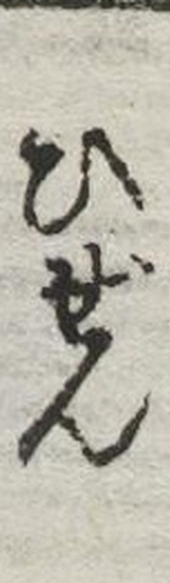ひぜん
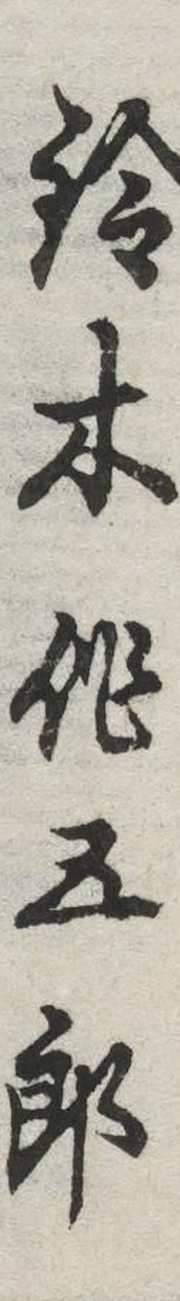鈴木作五郎
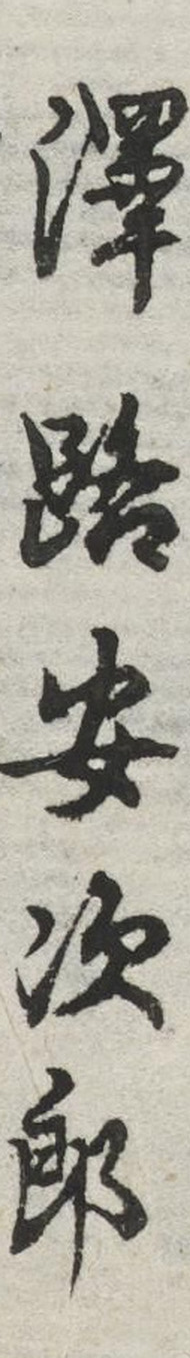澤路安次郎
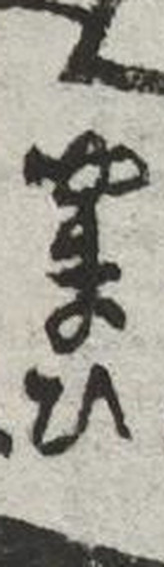やまひ
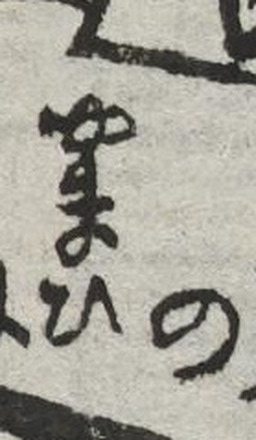やまひ
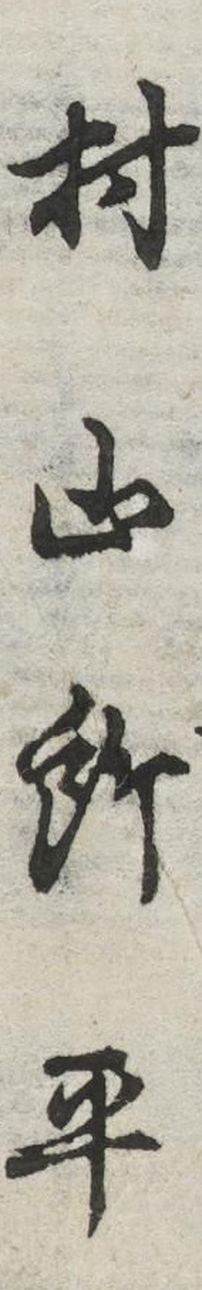村山所平

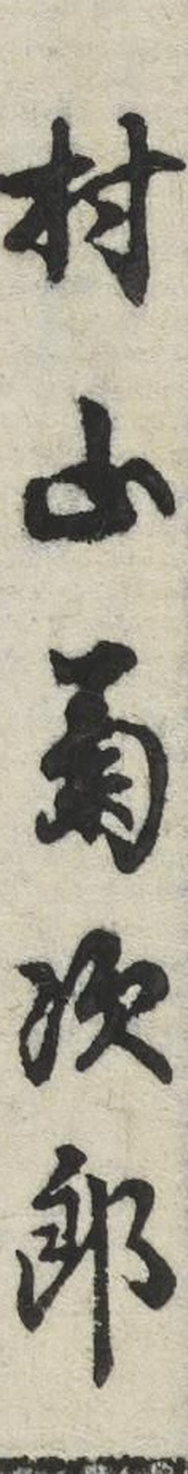村山菊次郎
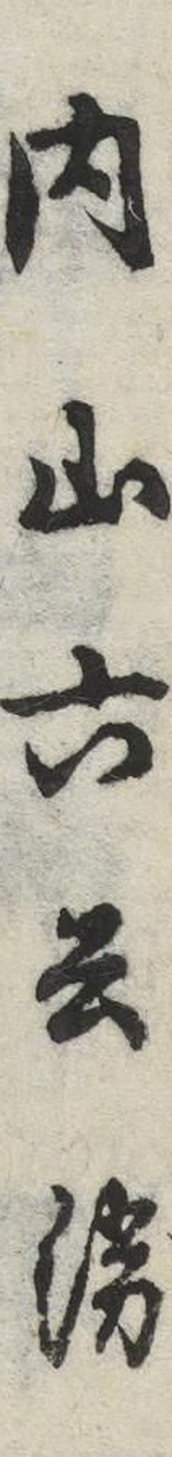内山六兵衛
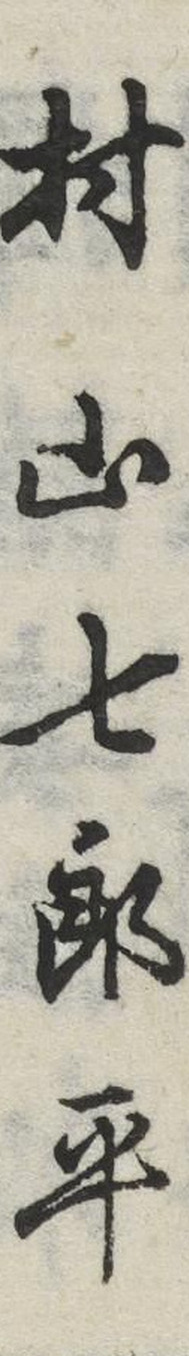村山七郎平
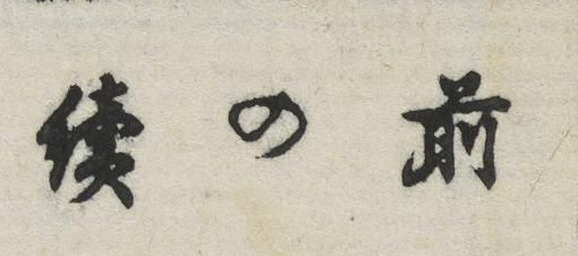前の続
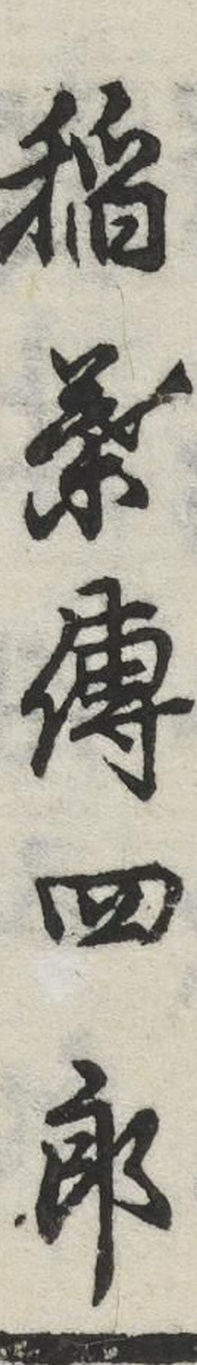稲葉伝四郎
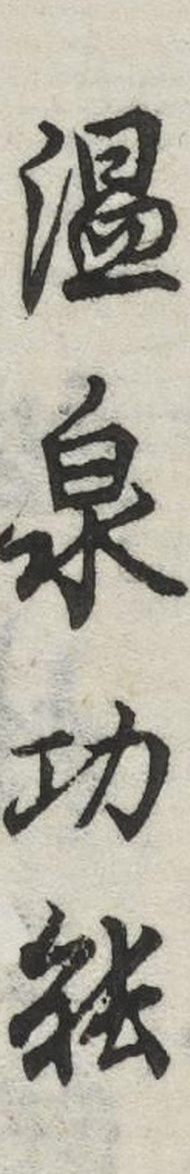温泉功能
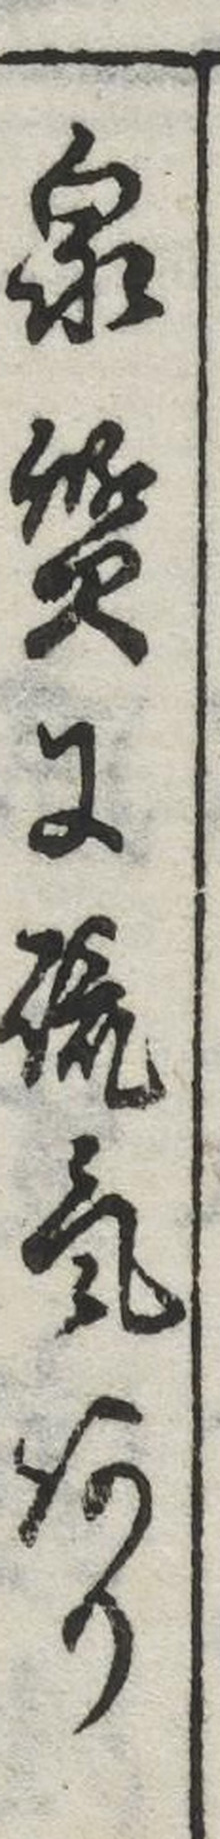泉質は硫気あり
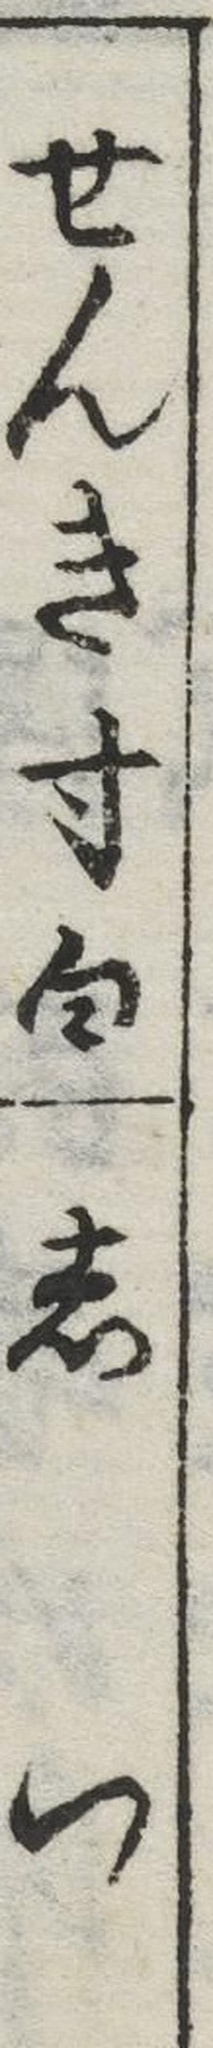せんき寸白しつ
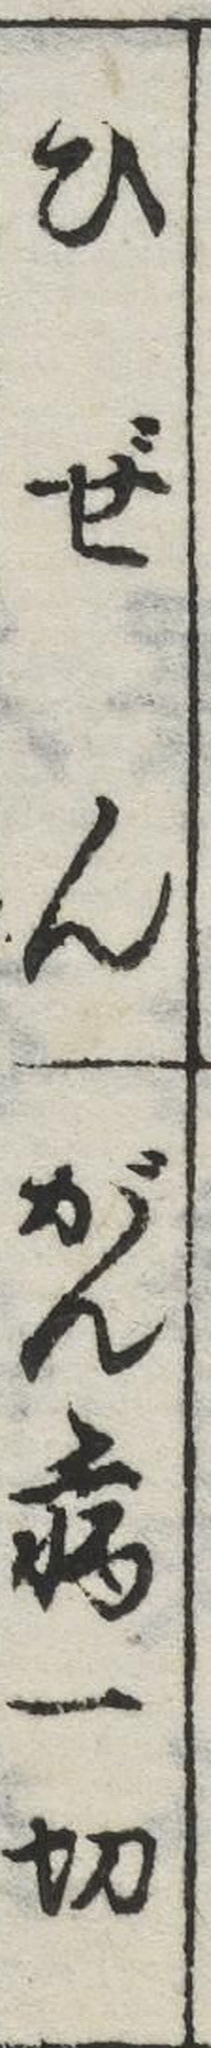ひぜんがん病一誠
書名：諸國温泉遊覽記　全
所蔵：東京大学地震研究所図書室 Earthquake Research Institute Library, The University of Tokyo, JAPAN
